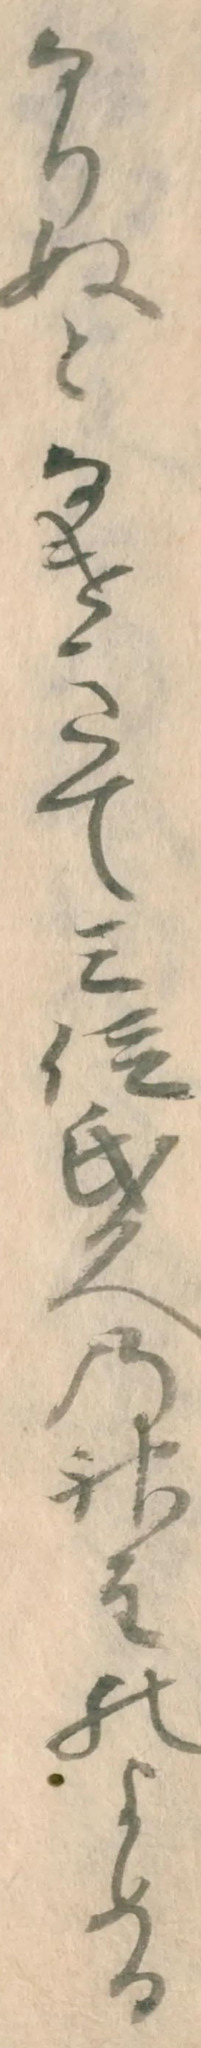なりぬとなけきて三位氏久の神主のよめる
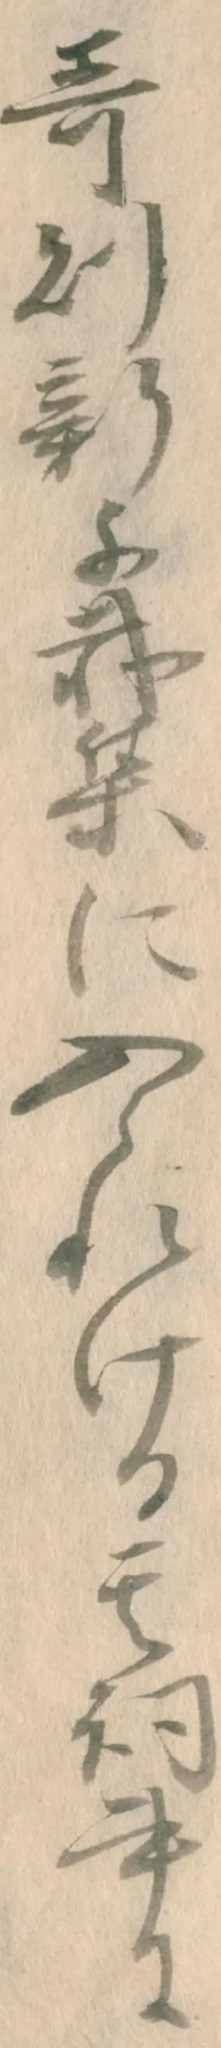哥則新千載集に入られける其詞書に
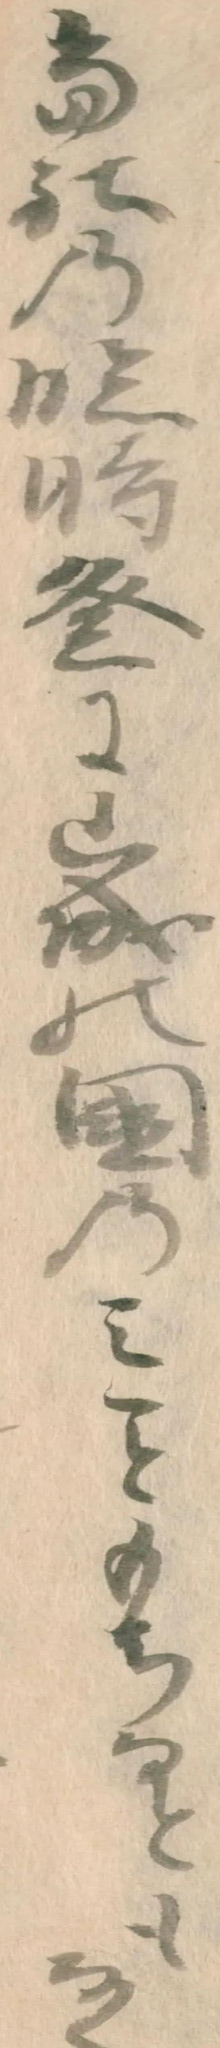当社の臨時祭に山城の国のみこともちなともなく
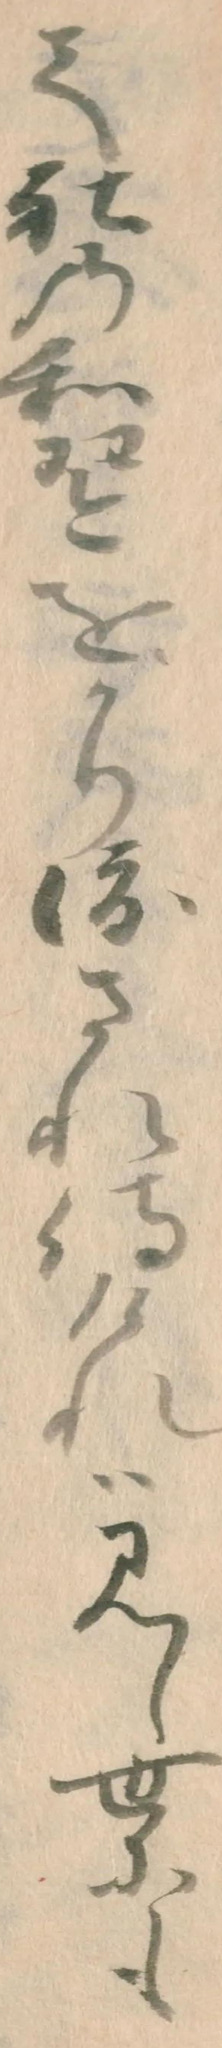て社の和琴をかり渡され侍けれは見し世にも
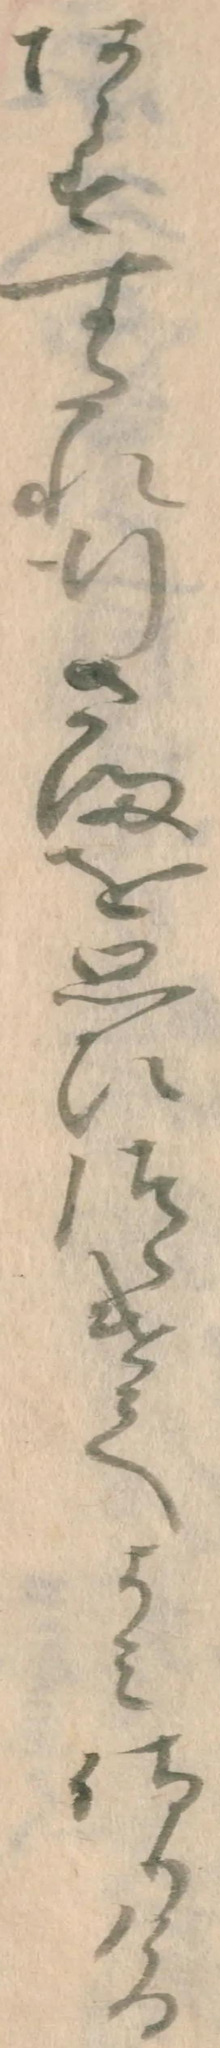あらすすたれ行さまを思ひつゝけてよみ侍りける
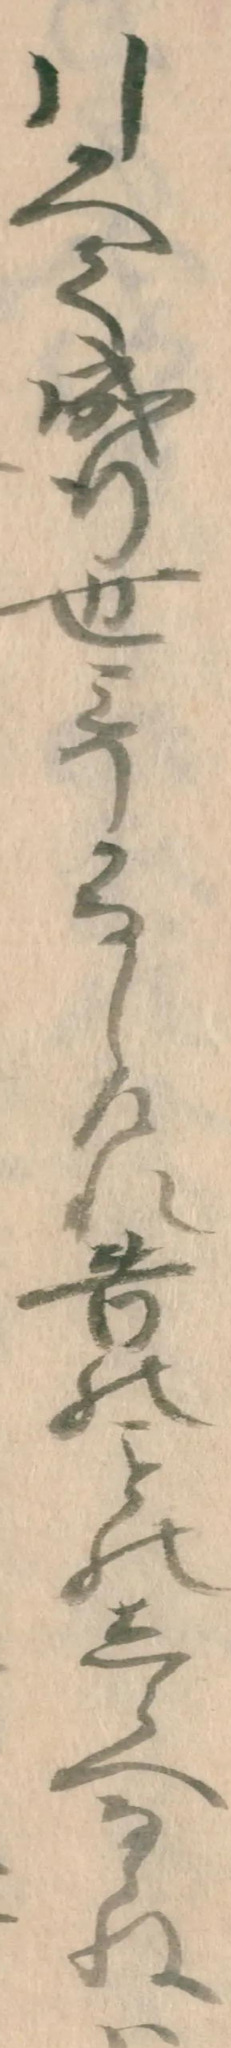引かへて成行世こそかなしけれ昔のことのしらへならねは
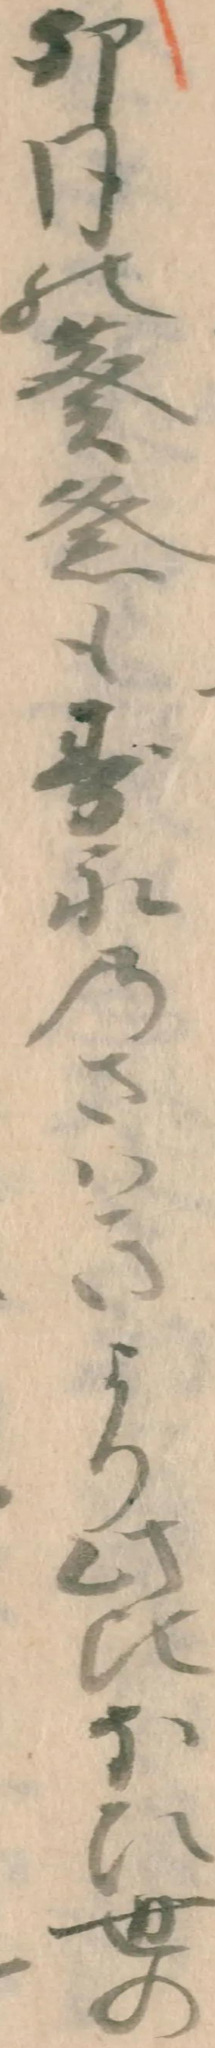卯月の葵祭も寿永のさはきより此比ほひ世の
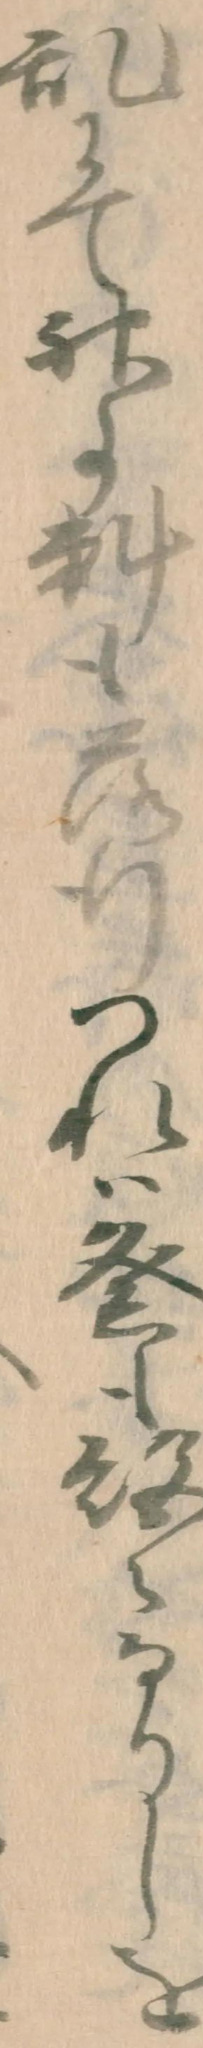乱にて神事料も落行つれは祭も絶々なりしを
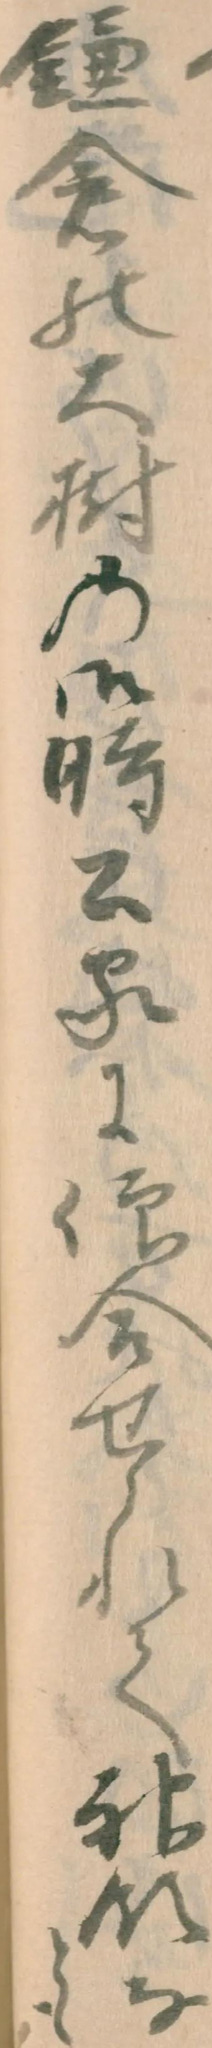鎌倉の大樹の御時公家に仰合せられて神領なとも
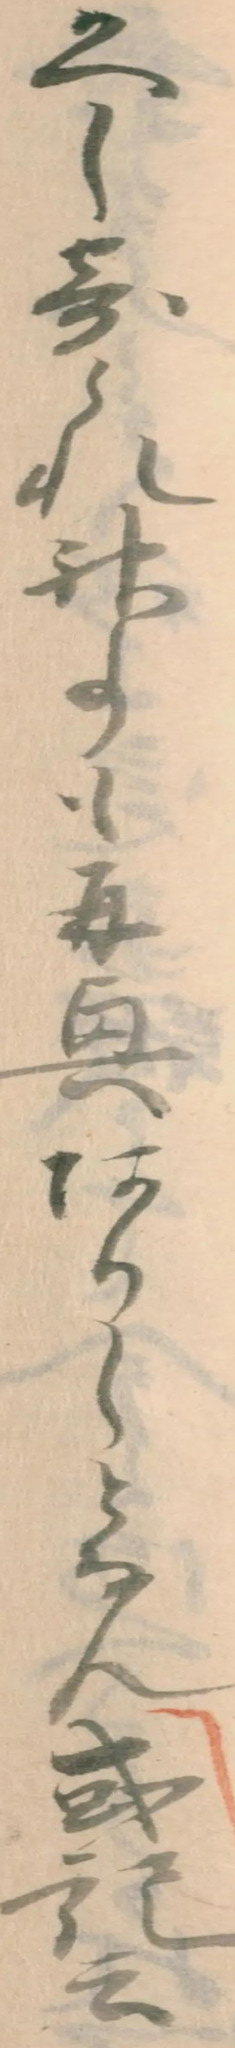かへし寄られ神事も再興ありしとなん或記云
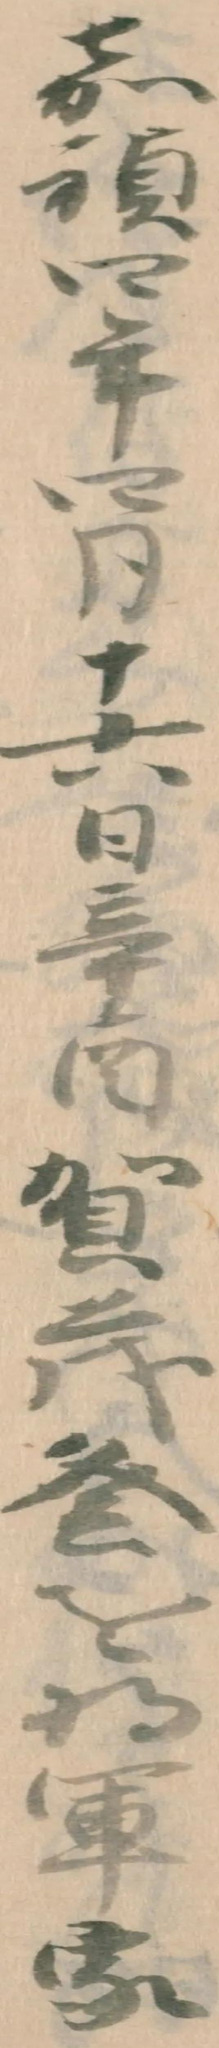嘉禎四年四月十六日辛酉賀茂祭を将軍家
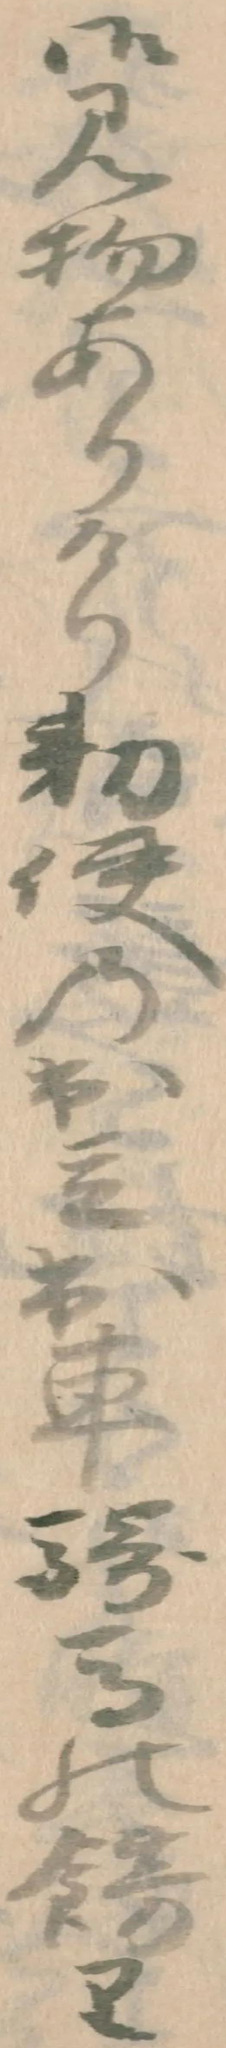御見物ありけり勅使の出立出車騎馬の餝り
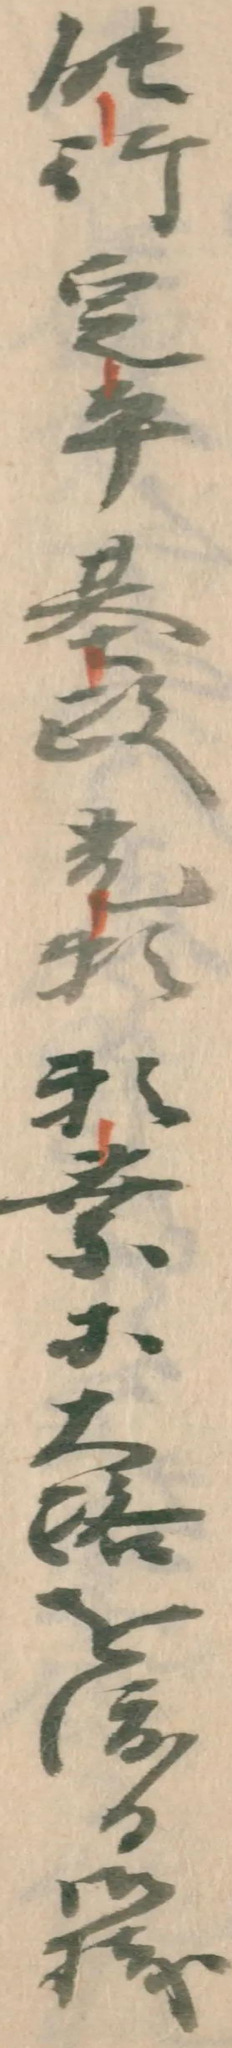能-行定-平基-政光-頼頼-業等大路を渡る御桟
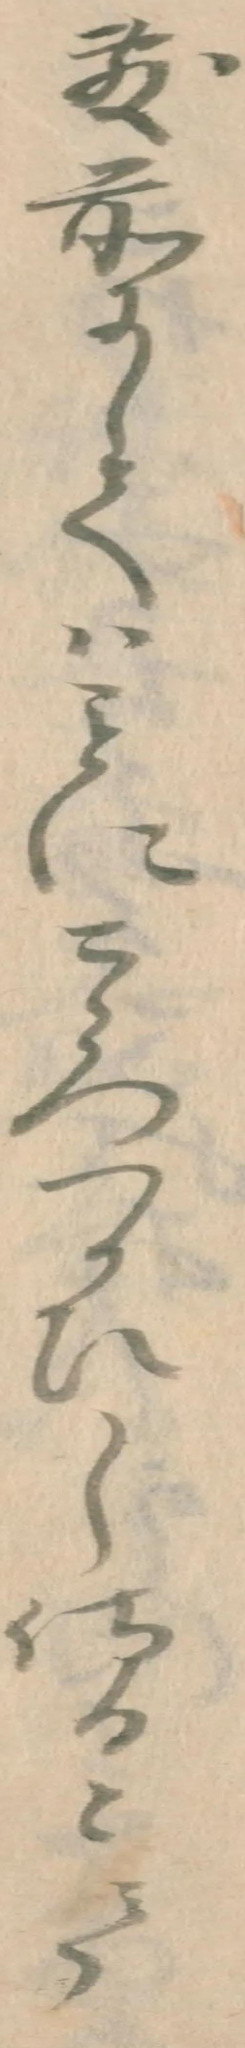敷前にしてはことにこゝろつかひし侍ると云々
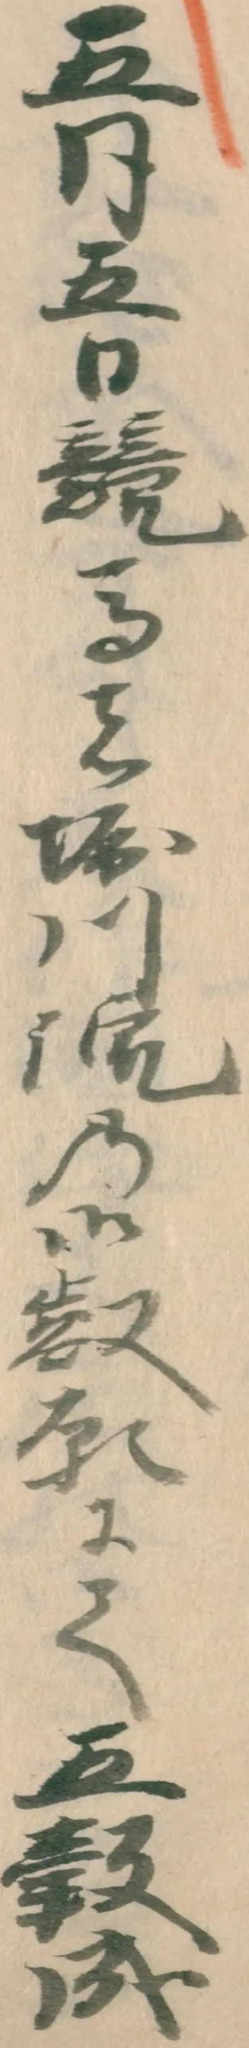五月五日競馬は堀川院の御叡願にて五穀成
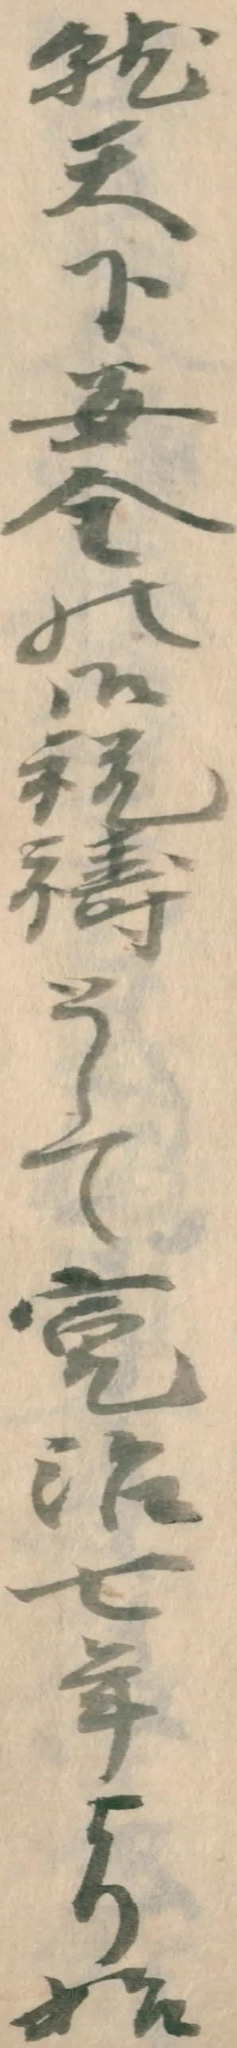就天下安全の御祝祷として寛治七年より始
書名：賀茂社記録. 第1冊
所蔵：国立国会図書館 National Diet Library, JAPAN
